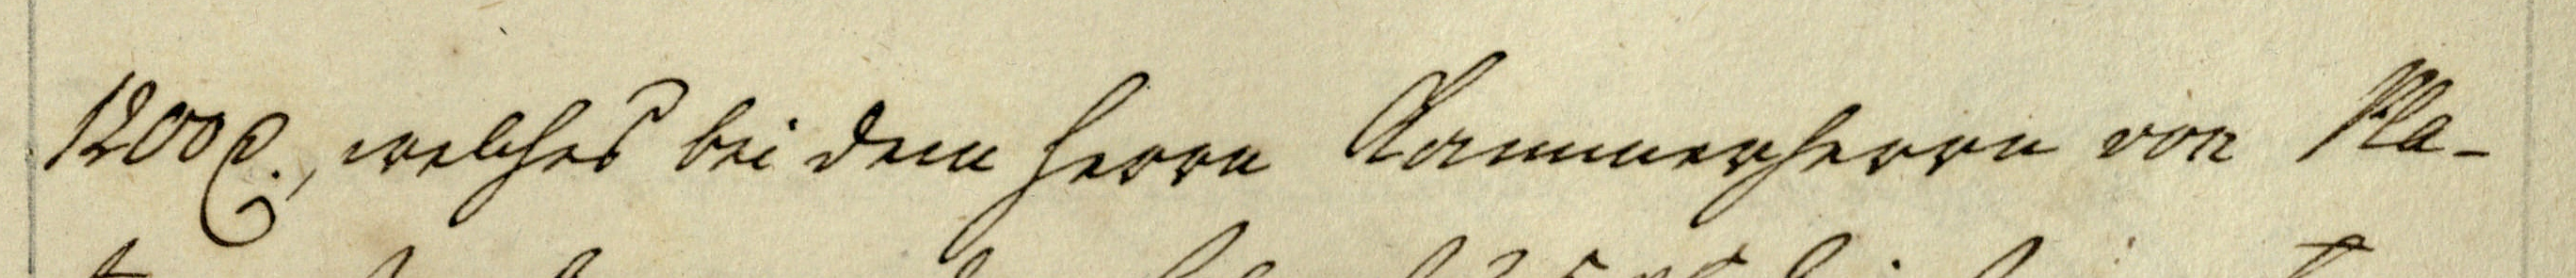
1200 l., welches bei dem Herrn Kammerherrn von Pla¬
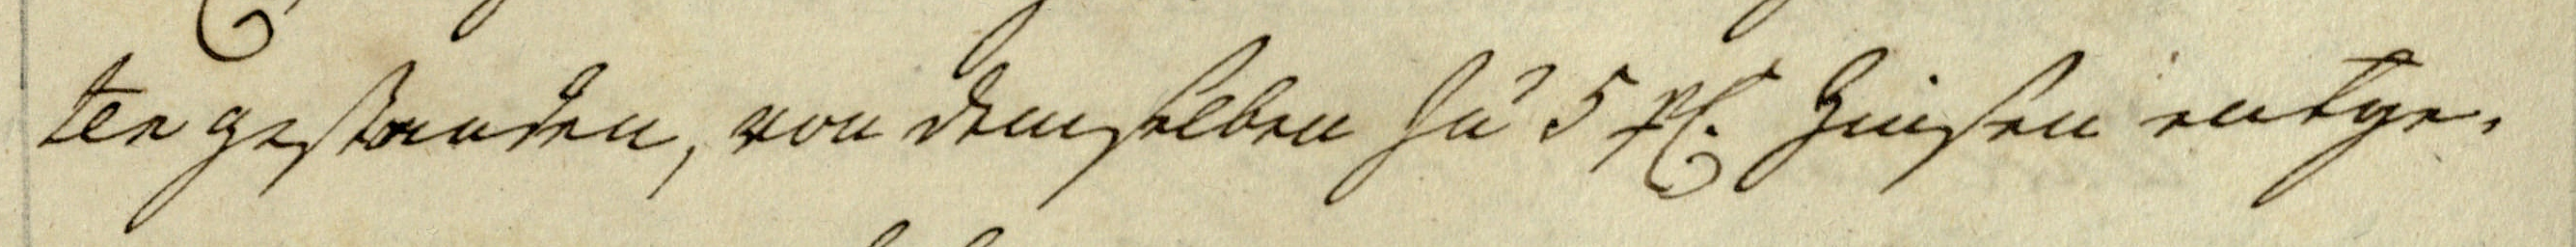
ten gestanden, von demselben zu 5 pl. Zinsen entge¬
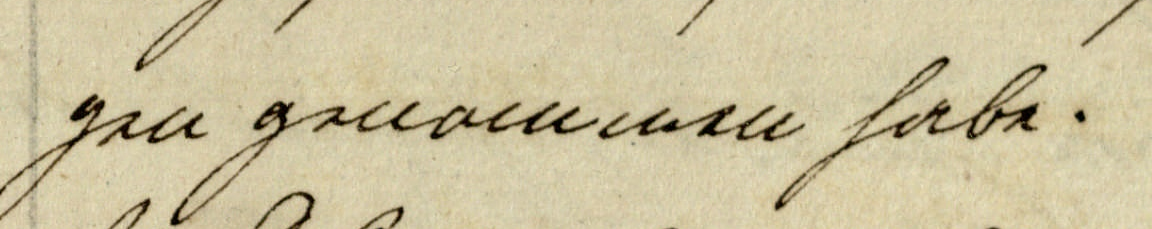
gen genommen habe.
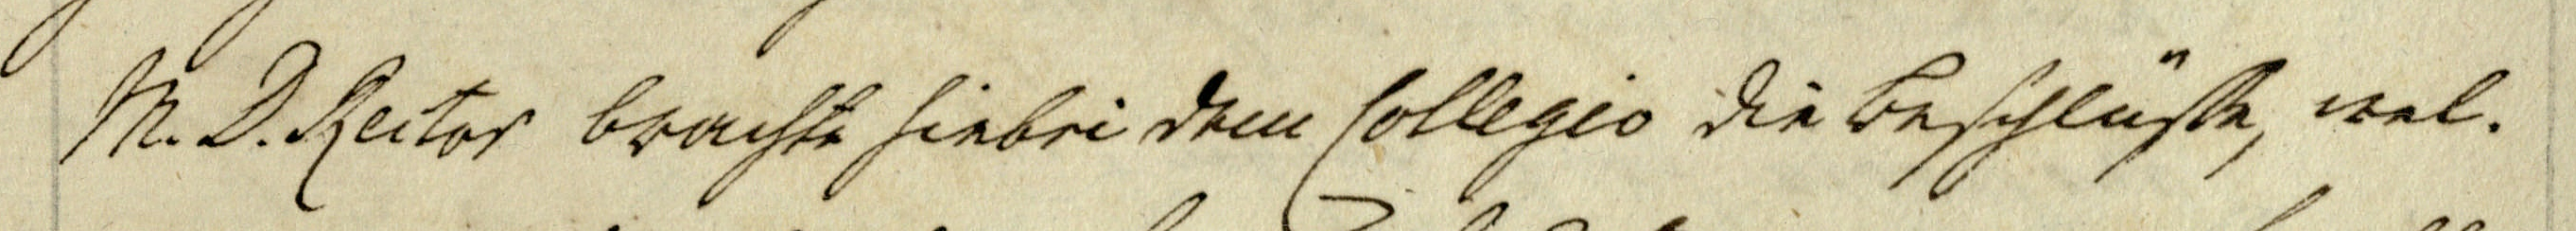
M. D. Rector brachte hiebei dem Collegio die Beschlüsse, wel¬
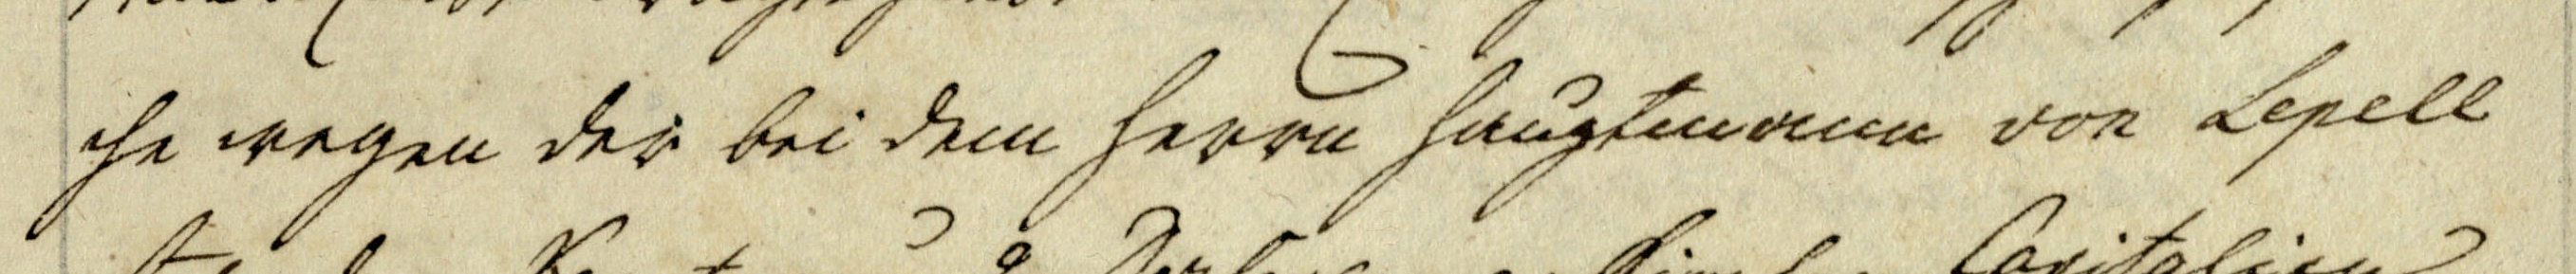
che wegen der bei dem Herrn Hauptmann von Lepell
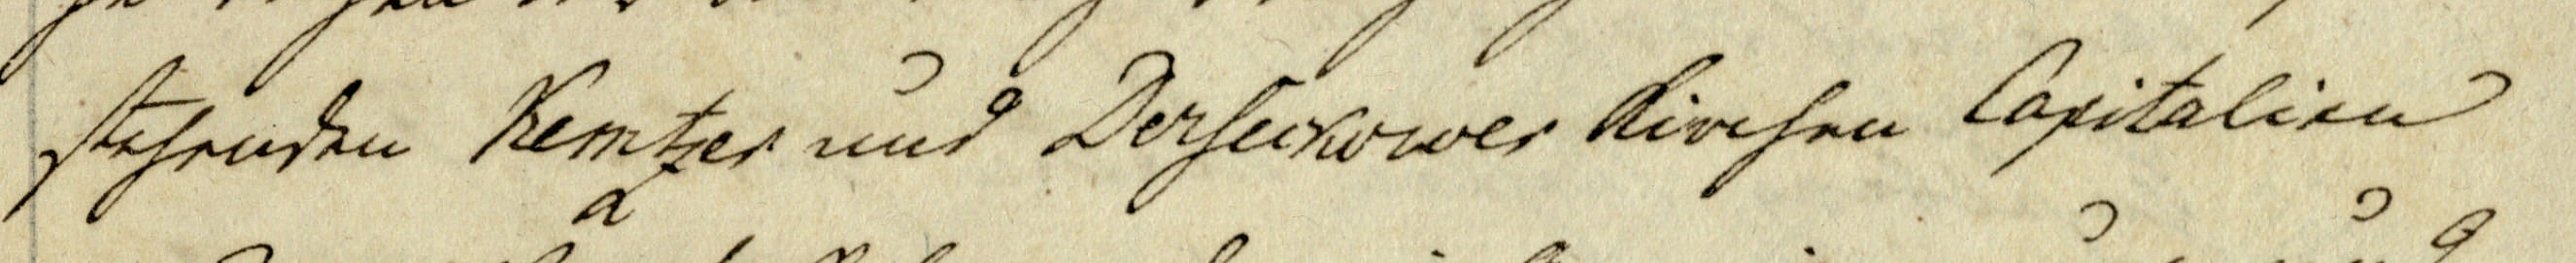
stehenden Kemtzer und Derseckower Kirchen Capitalien
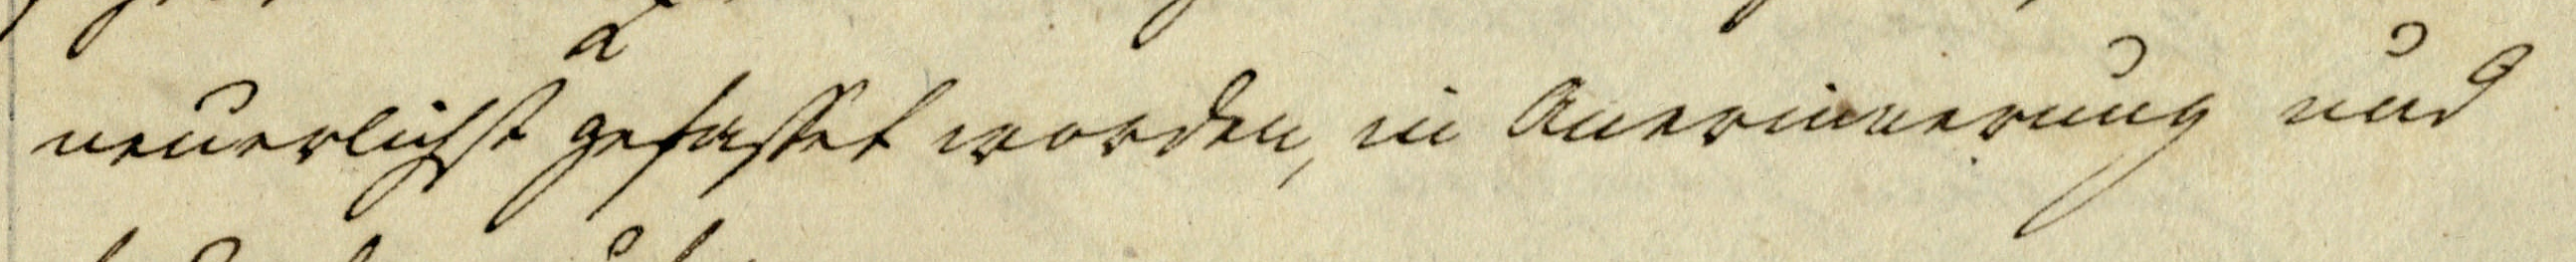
neuerlichst gefasset worden, in Anerinnerung und
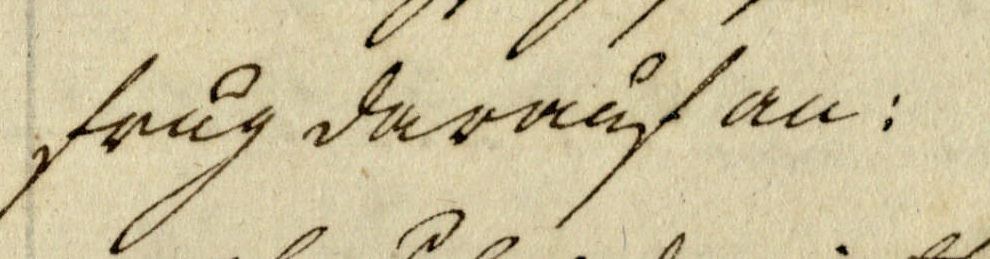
frug darauf an:
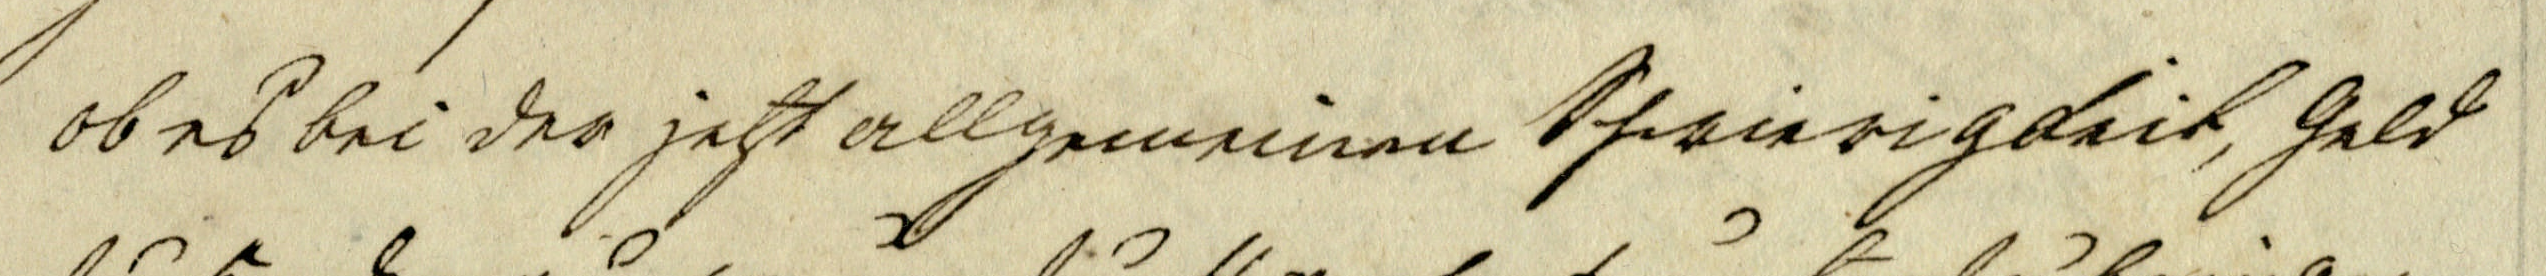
ob es bei der jetzt allgemeinen Schwierigkeit, Geld
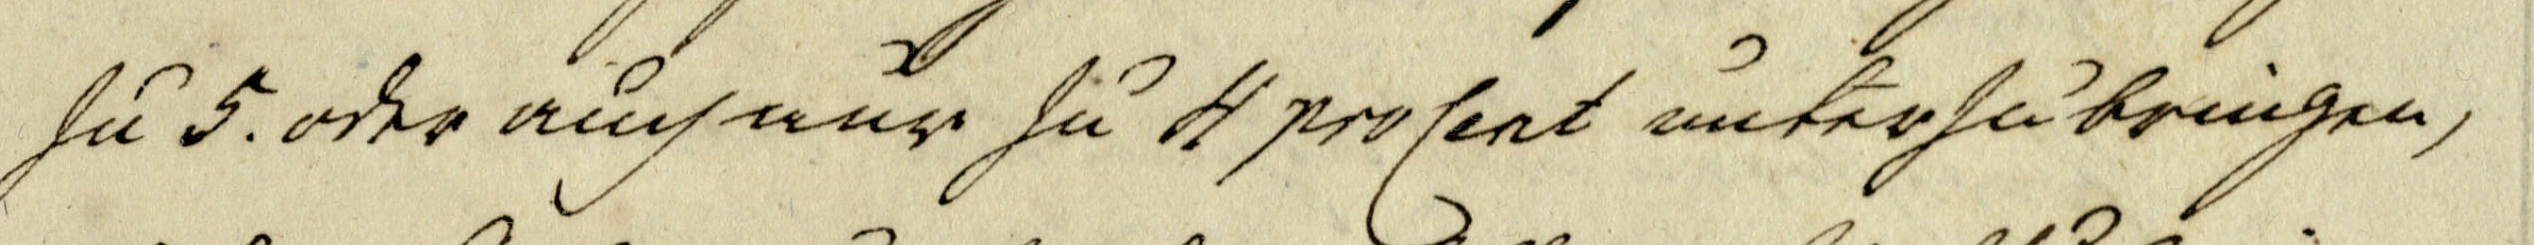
zu 5 oder auch nur zu 4 procent unterzu bringen,
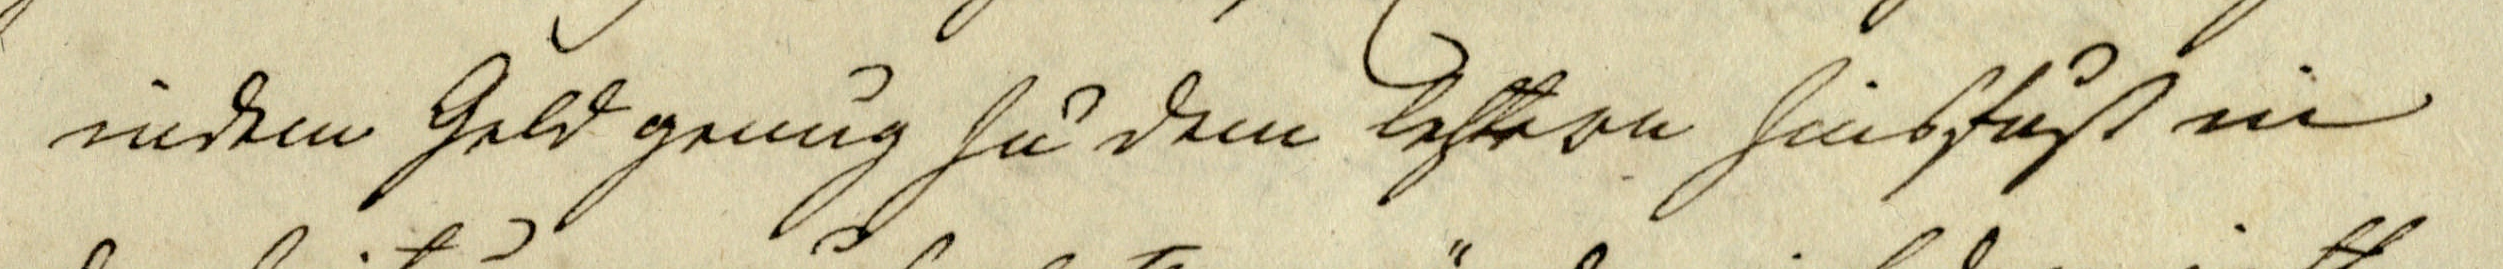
indem Geld genug zu dem letztern Zinsfuß in
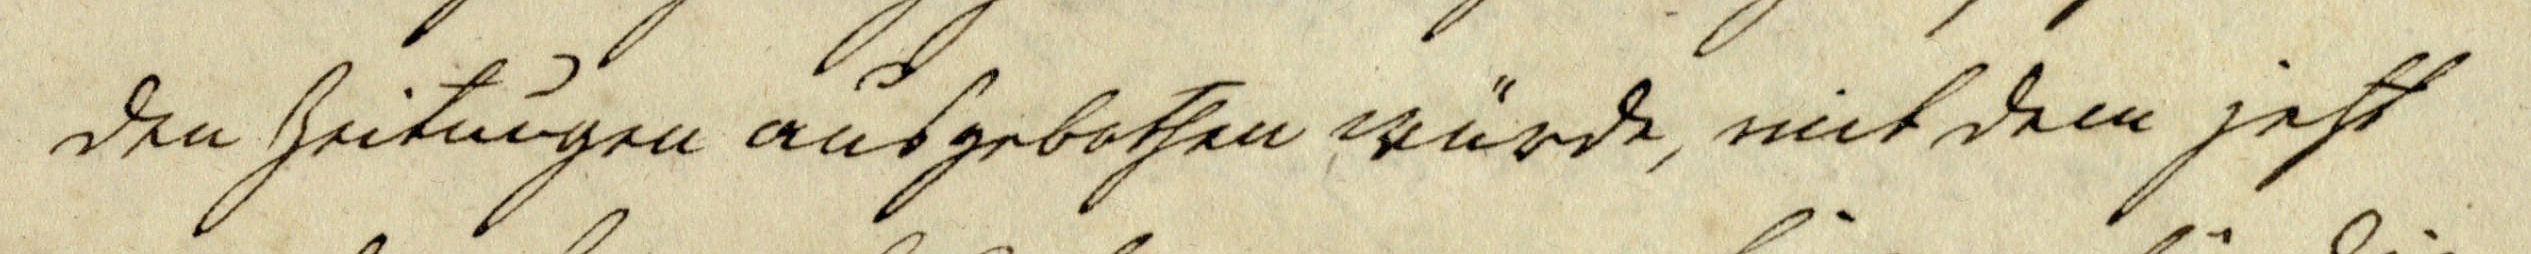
den Zeitungen ausgebothen würde, mit dem jetzt
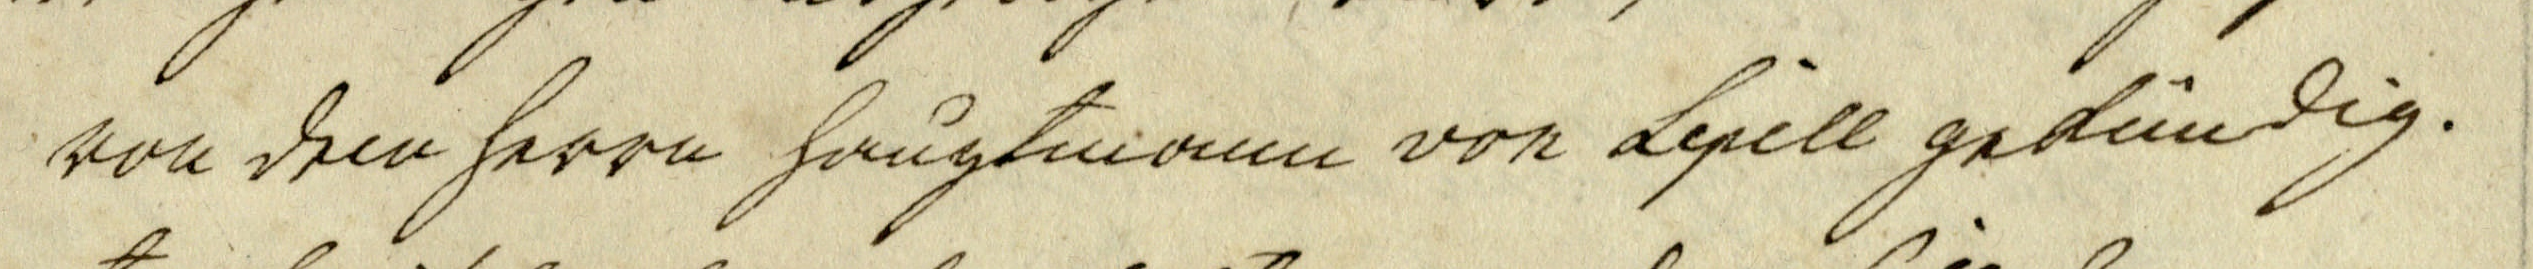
von dem Herrn Hauptmann von Lepell gekündig¬
